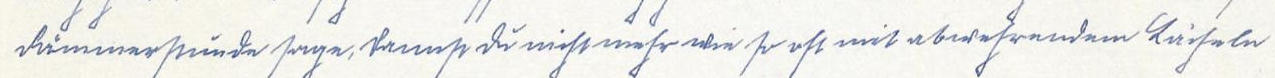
Dämmerstunde sage, kannst du nicht mehr wie so oft mit abwehrendem Lächeln
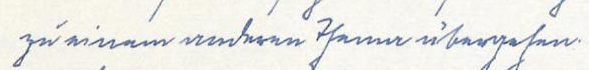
zu einem anderen Thema übergehen.
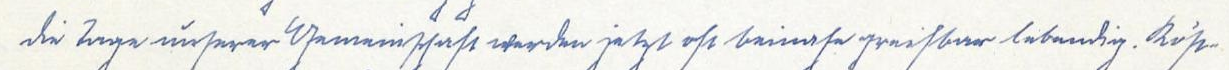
Die Tage unserer Gemeinschaft werden jetzt oft beinahe greifbar lebendig. Köst-
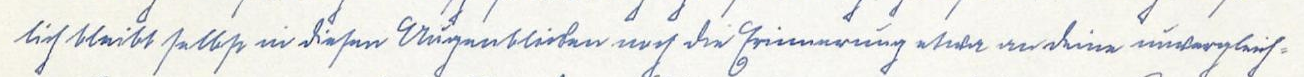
lich bleibt selbst in diesen Augenblicken noch die Erinnerung etwa an deine unvergleich-
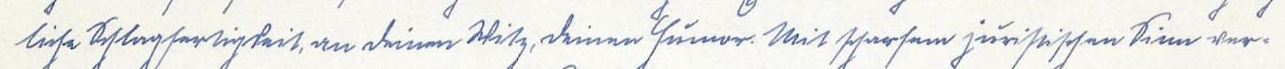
liche Schlagfertigkeit, an deinen Witz, deinen Humor. Mit scharfem juristischen Sinne ver-
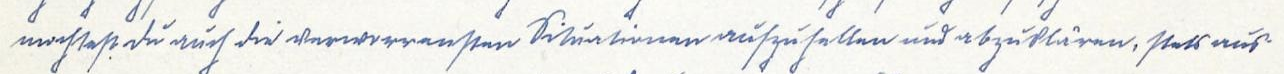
mochtest du auch die verworrensten Situationen aufzuhellen und abzuklären, stets aus-
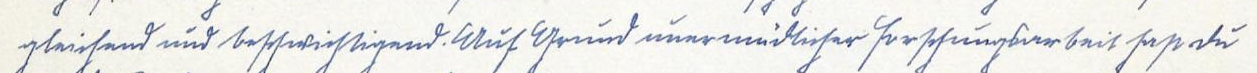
gleichend und beschwichtigend. Aufgrund unermüdlicher Forschungsarbeit hast du
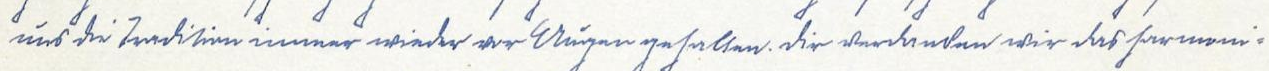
uns die Tradition immer wieder vor Augen gehalten. Dir verdanken wir das harmoni-
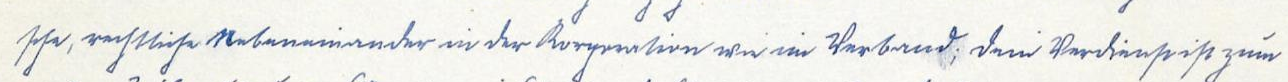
sche, rechtliche Nebeneinander in der Korporation wie im Verband; Dein Verdienst ist zum
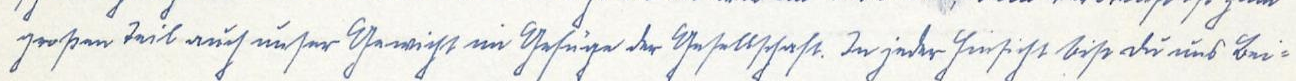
großen Teil auch unser Gewicht im Gefüge der Gesellschaft. In jeder Hinsicht bist du uns Bei-
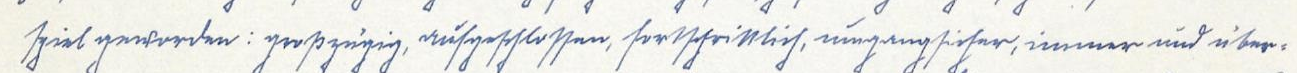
spiel geworden: großzügig, aufgeschlossen, fortschrittlich, umgangssicher, immer und über-
